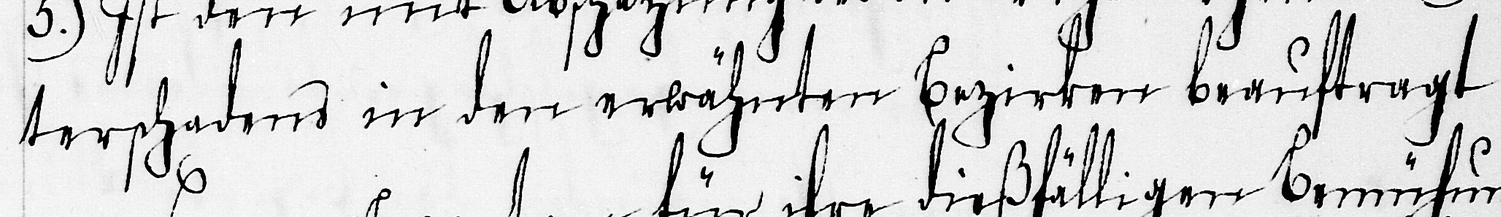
terschadens in den erwähnten Bezirken beauftragt
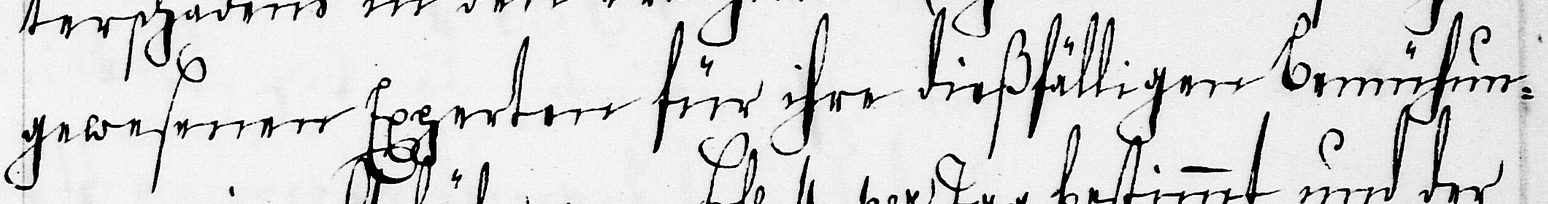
gewesenen Experten für ihre dießfälligen Bemühun¬
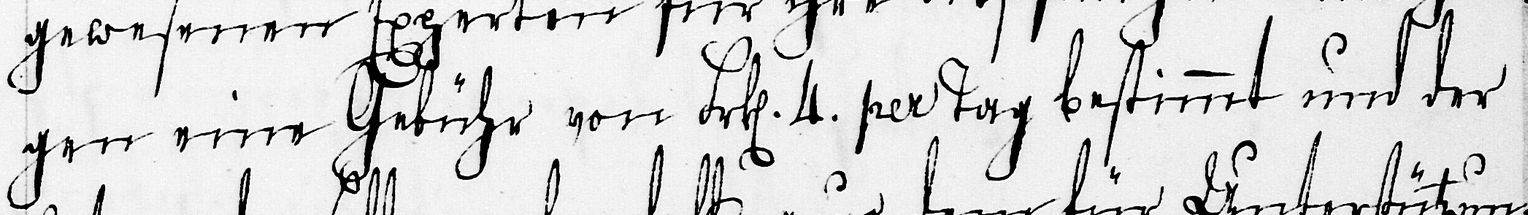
gen eine Gebühr von Frk[en]. 4. per Tag bestimmt und der
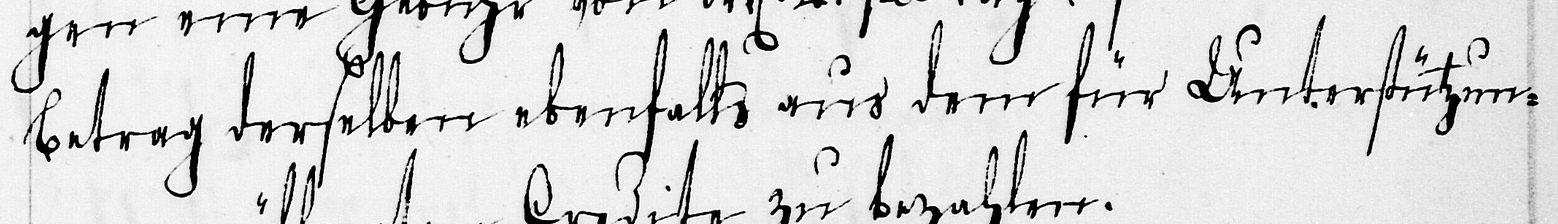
Betrag derselben ebenfalls aus dem für Unterstützun¬
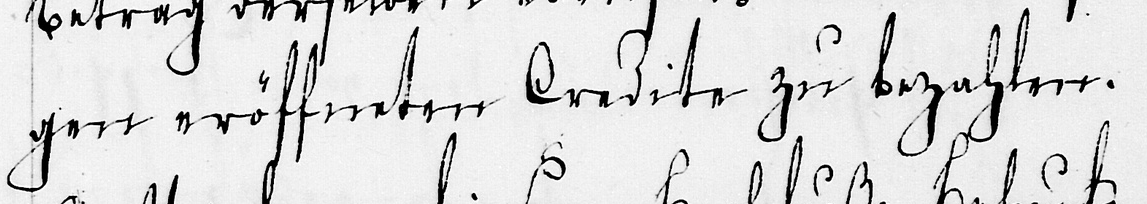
gen eröffneten Credite zu bezahlen.
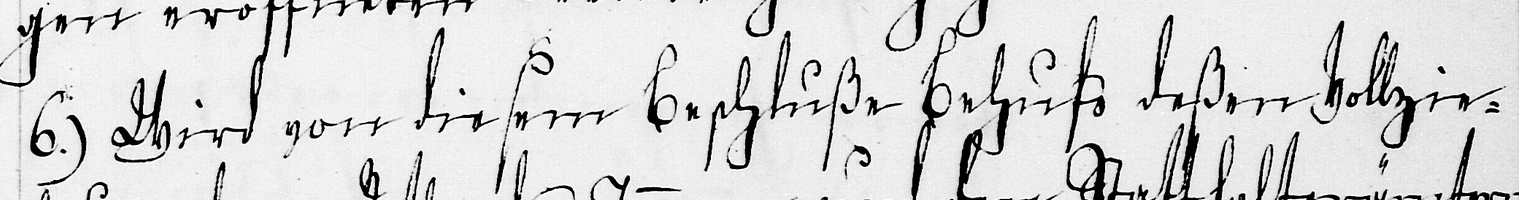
6.) Wird von diesem Beschluße Behufs deßen Vollzie¬
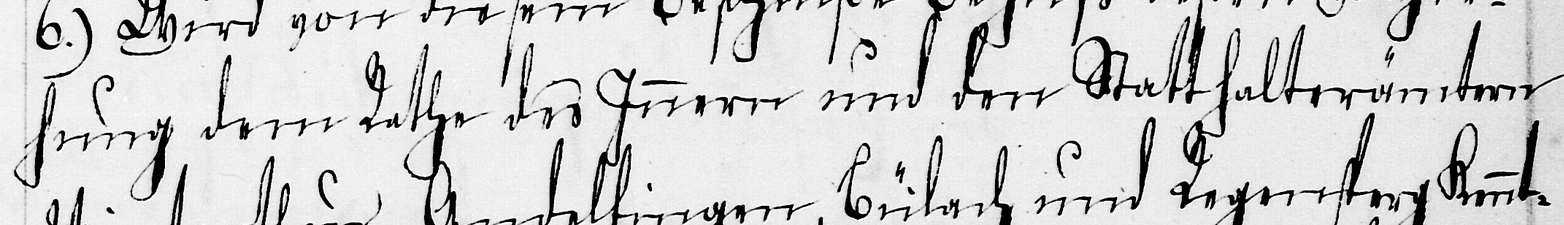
hung dem Rathe des Innern und den Statthalterämtern
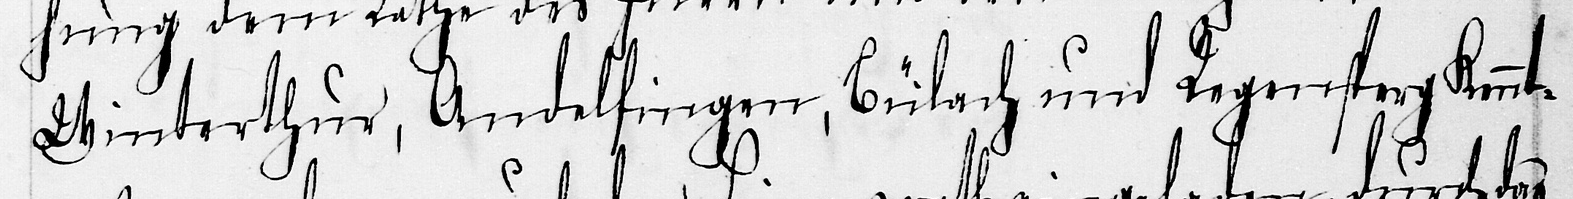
Winterthur, Andelfingen, Bülach und Regensperg Kenn¬
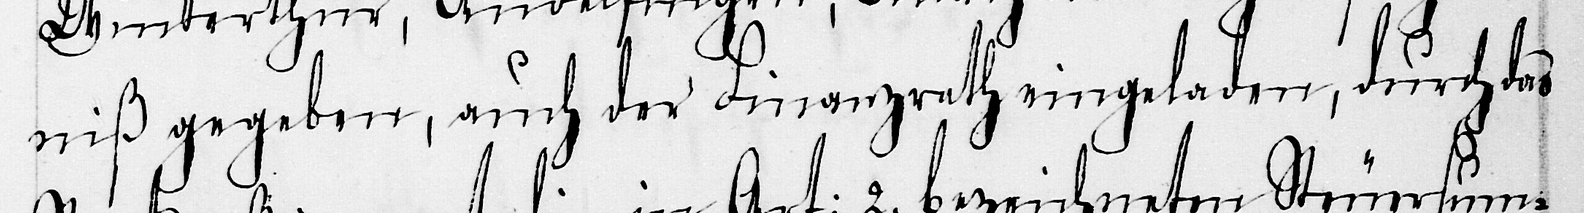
tniß gegeben, auch der Finanzrath eingeladen, durch das
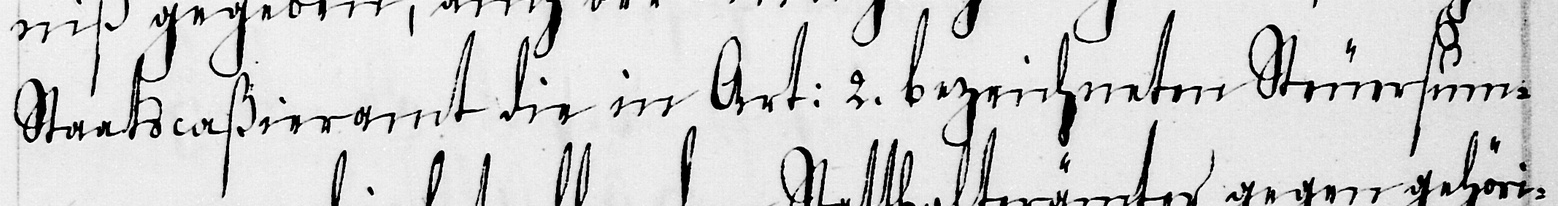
Staatscaßieramt die in Art: 2. bezeichneten Steuersum¬
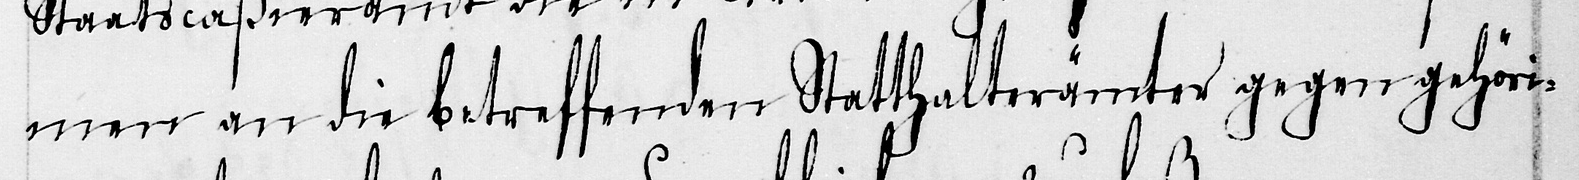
men an die betreffenden Statthalterämter gegen gehöri¬
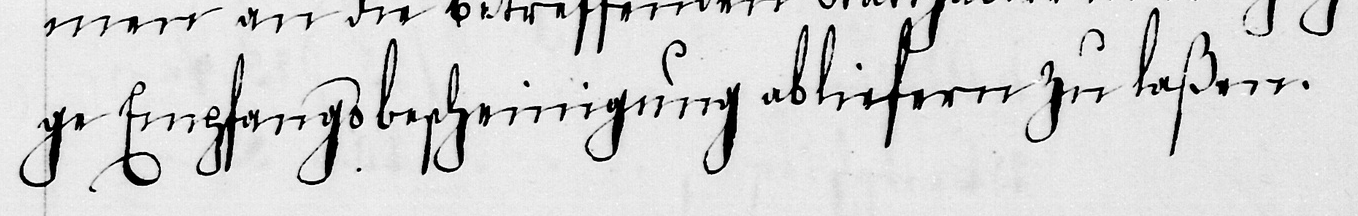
ge Empfangsbescheinigung abliefern zu laßen.
